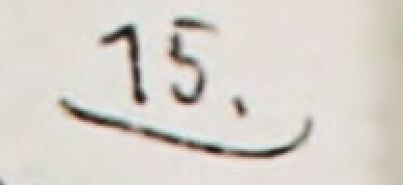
15.
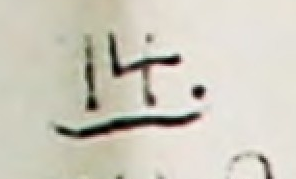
14.
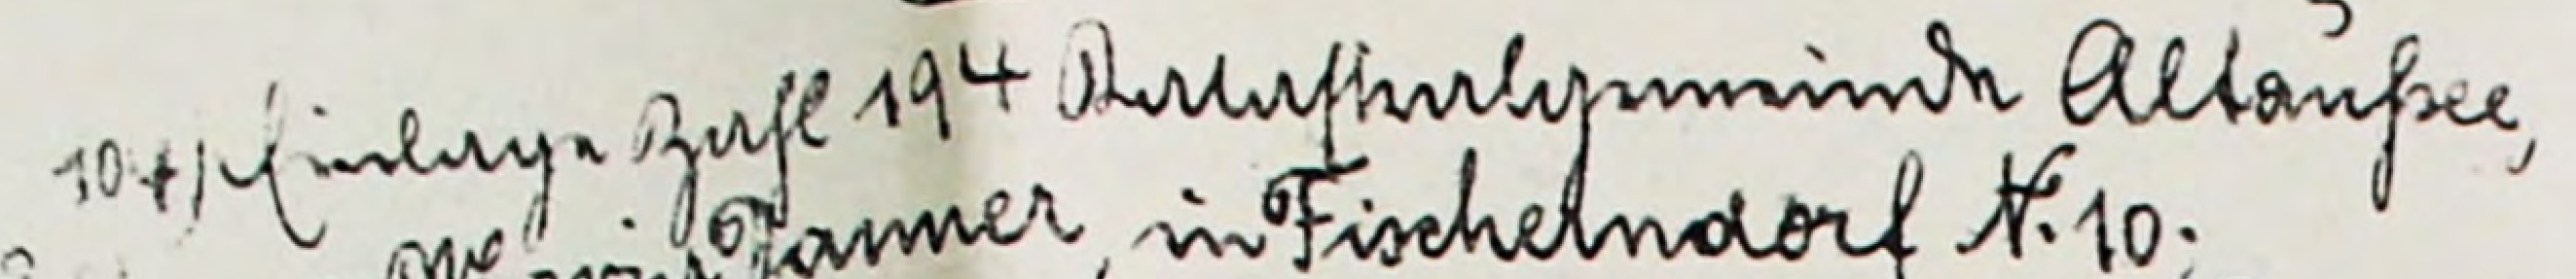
104) Einlage Zahl 194 Katastralgemeinde Altaussee,
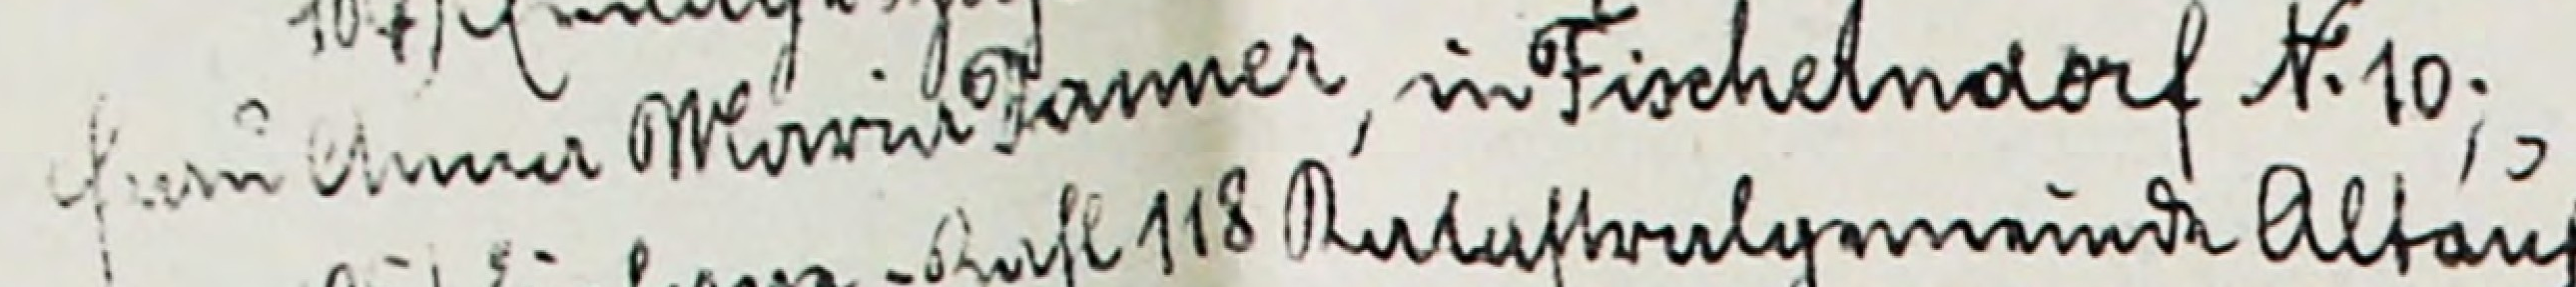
Frau Anna Maria Danner, in Fischerndorf № 10;
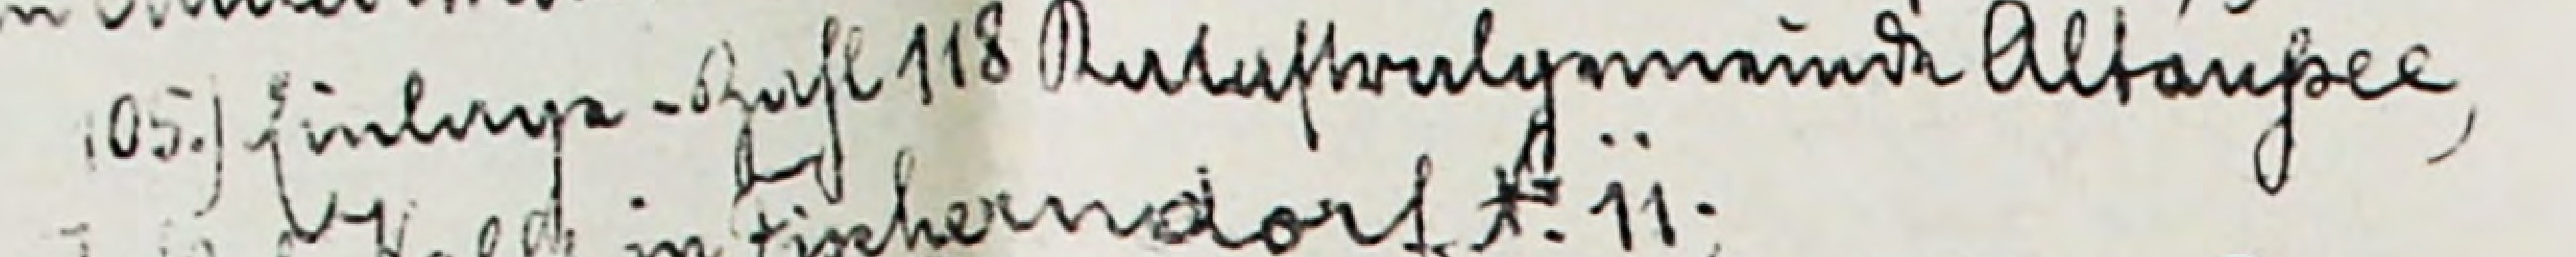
105.) Einlage - Zahl 118 Katastralgemeinde Altaussee,
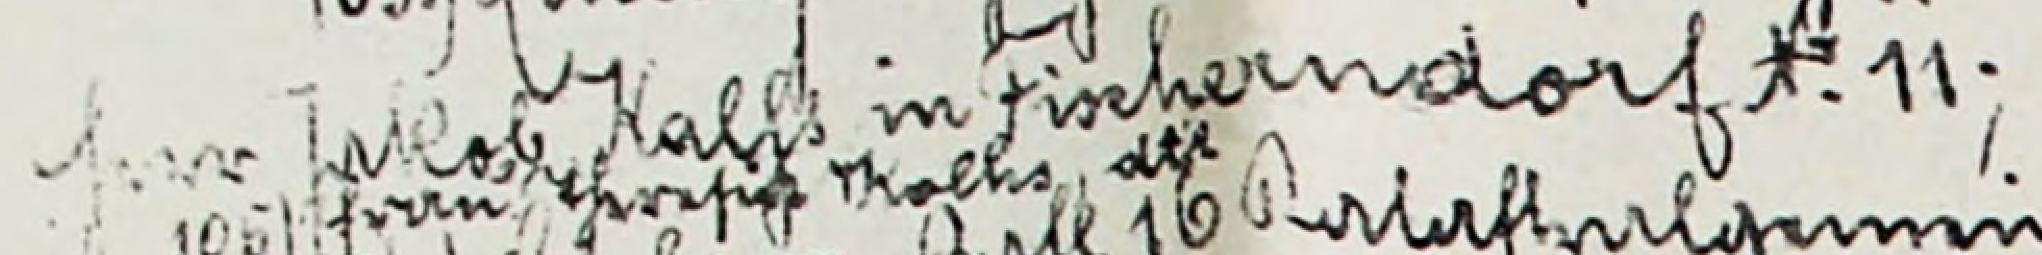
Herr Jakob Kalhs in Fischerndorf № 11;
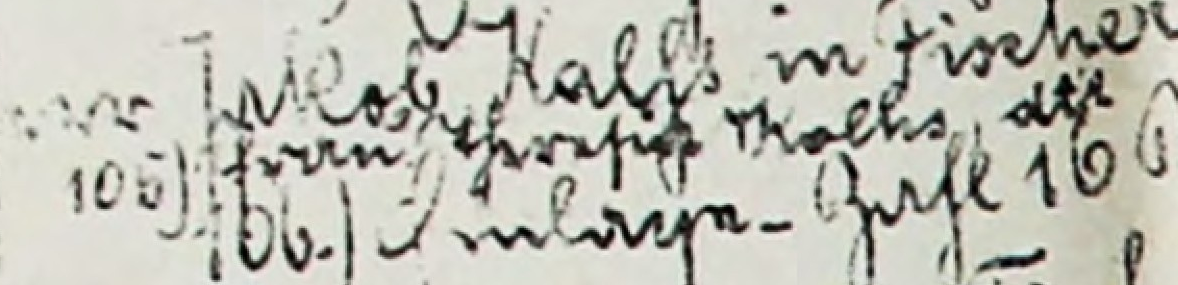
105) Frau Theresia Kalhs Alt
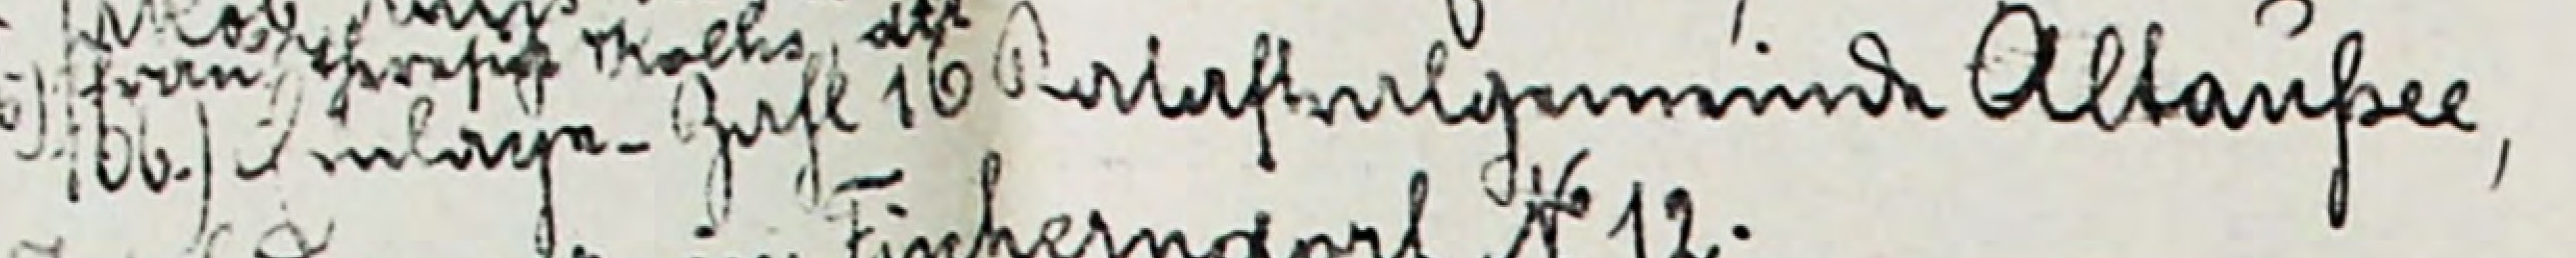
106.) Einlage - Zahl 16 Katastralgemeinde Altaussee,
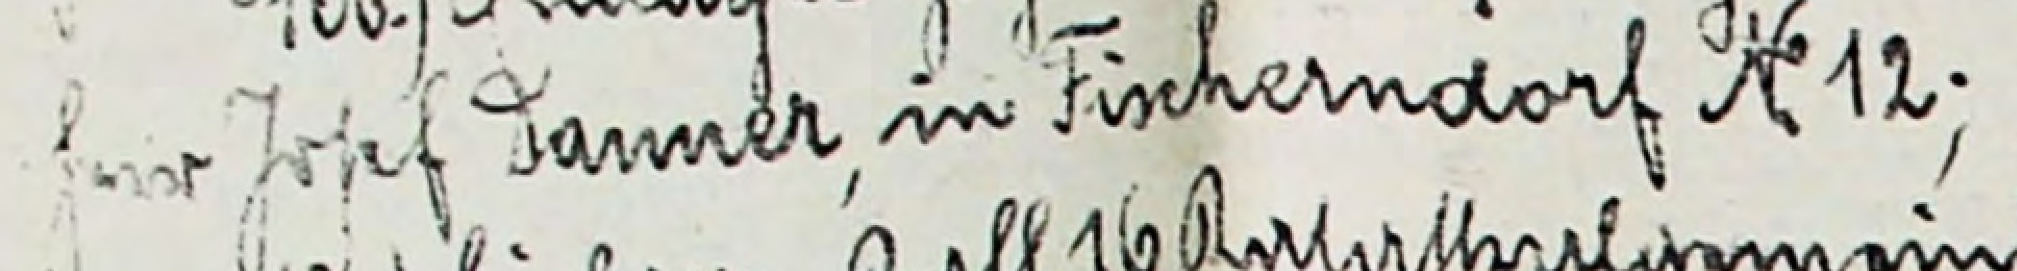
Herr Josef Danner, in Fischerndorf № 12;
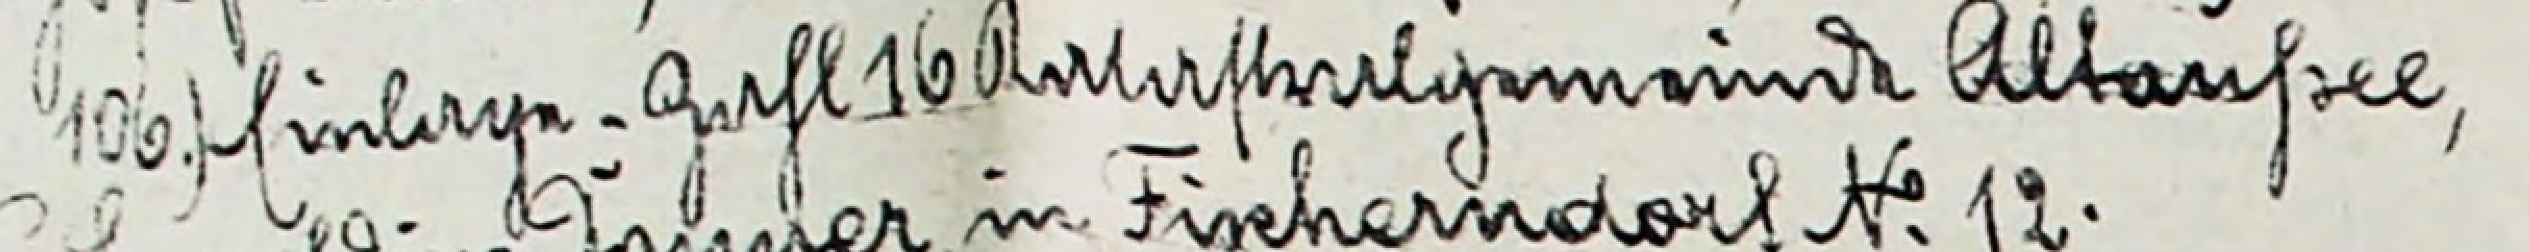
106.) Einlage - Zahl 16 Katastralgemeinde Altaussee,
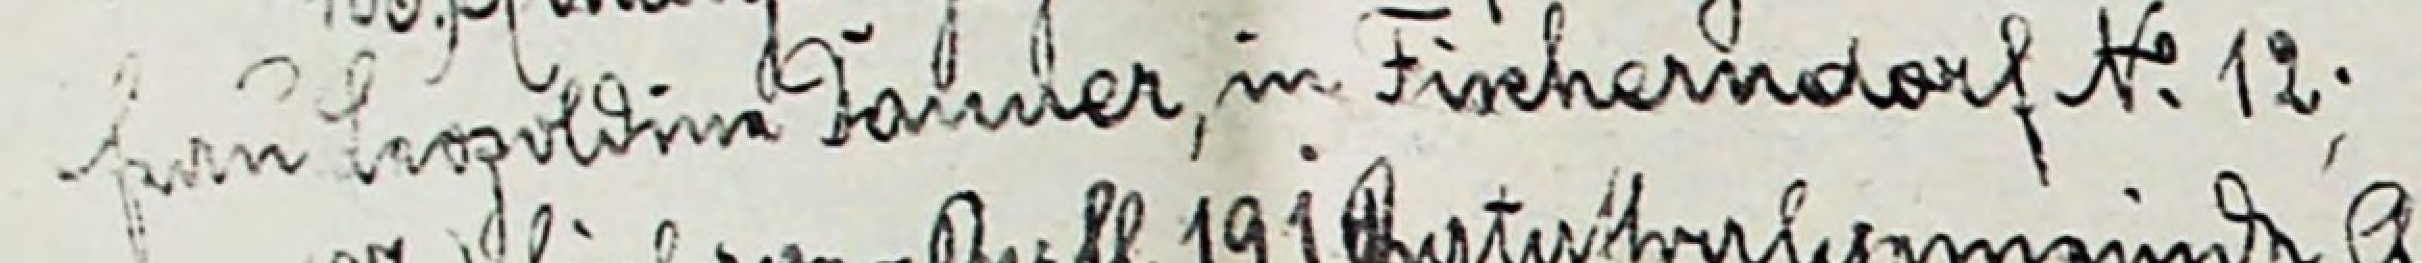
Frau Leopoldine Danner, in Fischerndorf № 12;
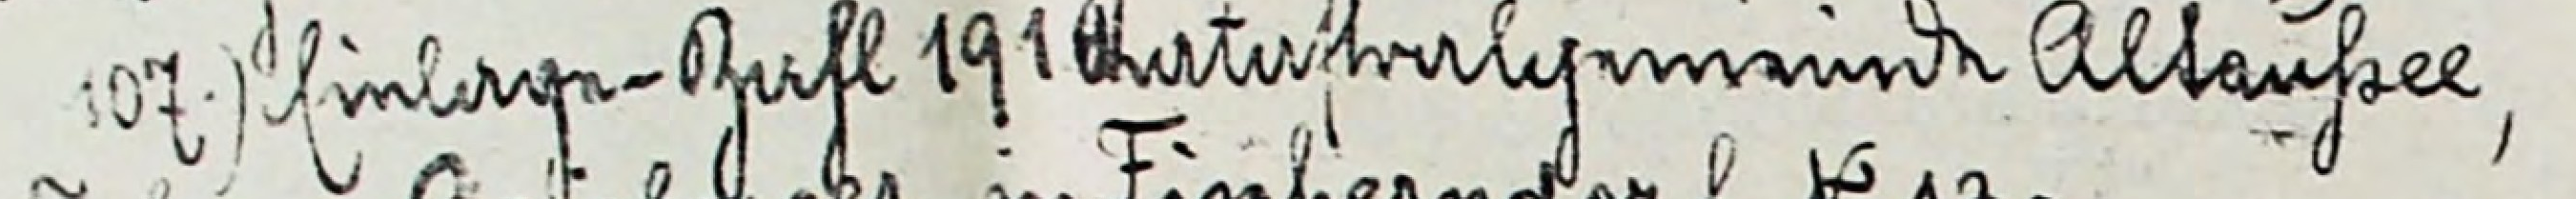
107.) Einlage - Zahl 191 Katastralgemeinde Altaussee,
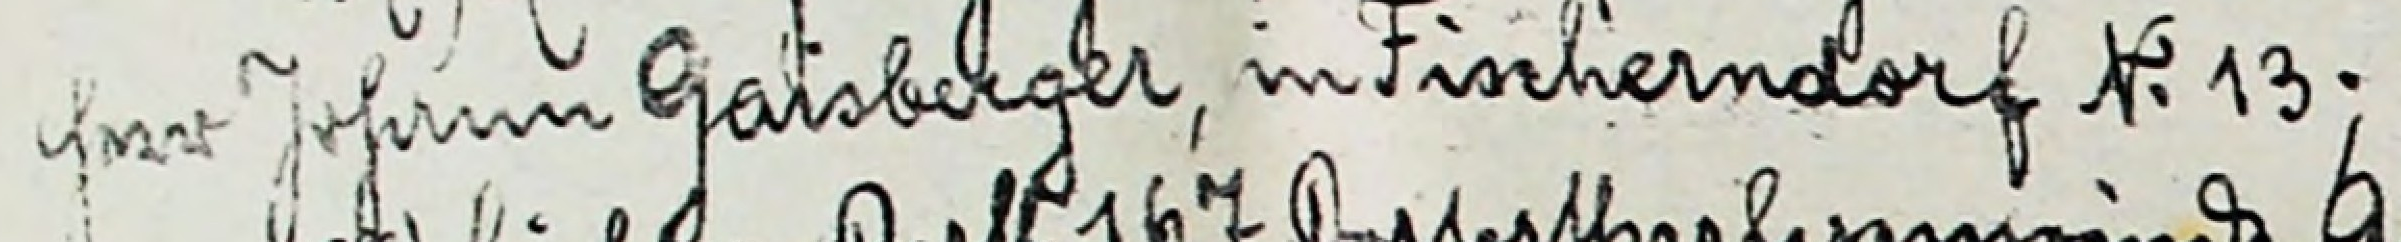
Herr Johann Gaisberger, in Fischerndorf № 13;
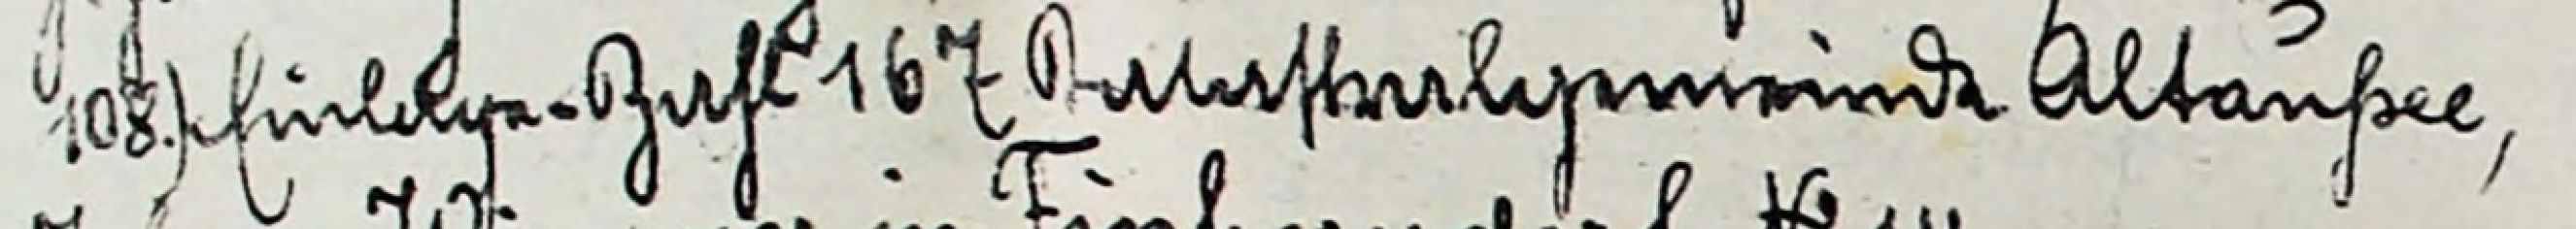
108.) Einlage - Zahl 167 Katastralgemeinde Altaussee,
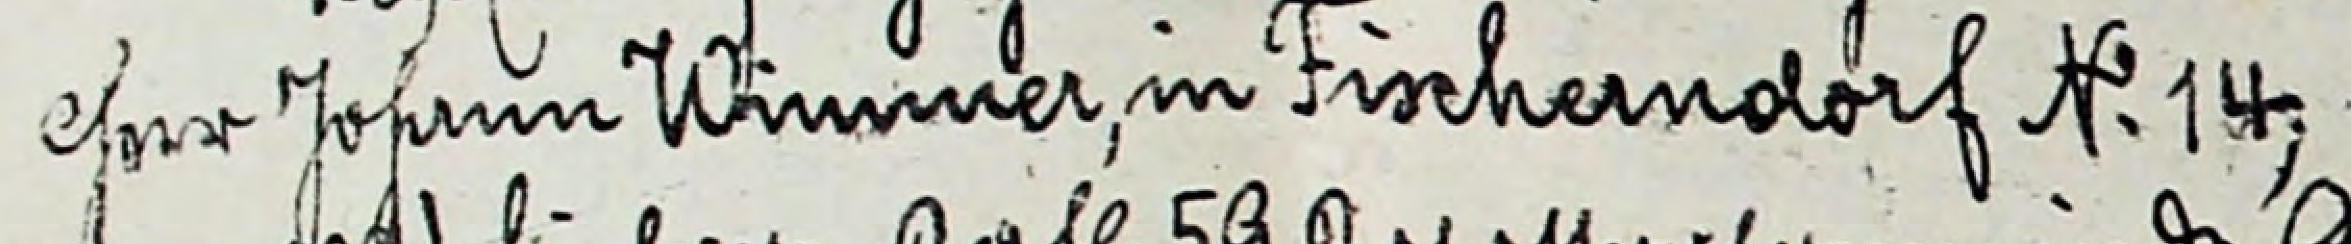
Herr Johann Wimmer, in Fischerndorf № 14;
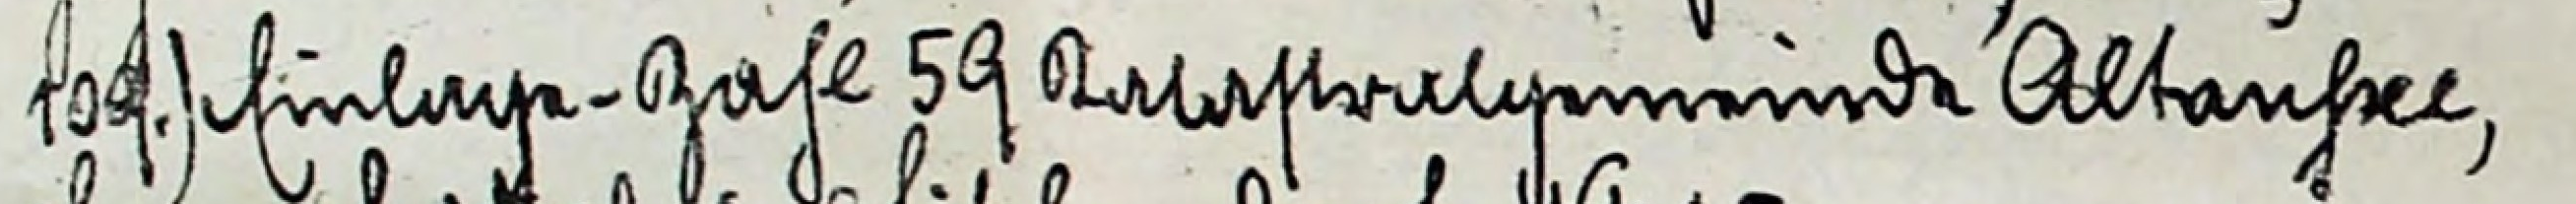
109.) Einlage - Zahl 59 Katastralgemeinde Altaussee,
